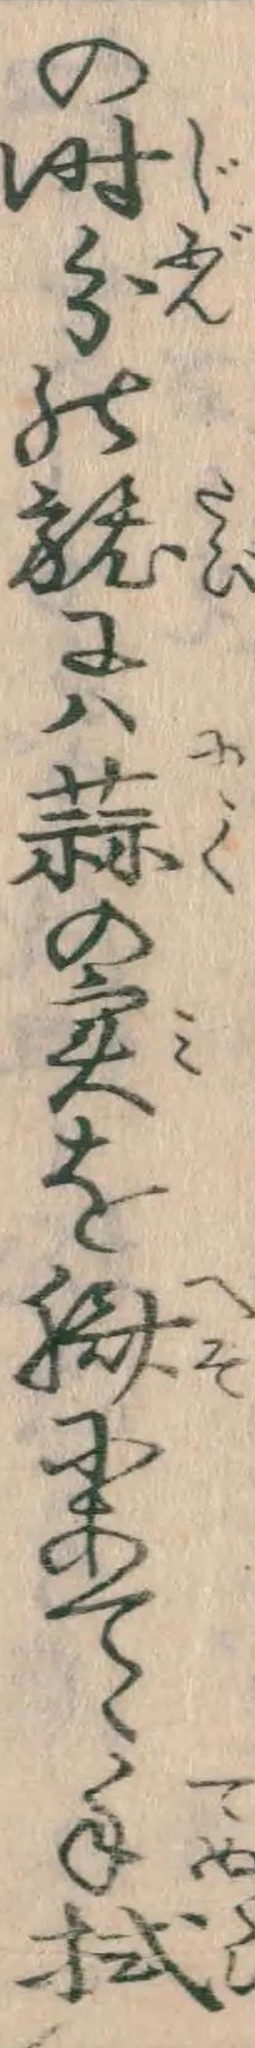の時分の旅には蒜の実を臍にあてゝ手拭
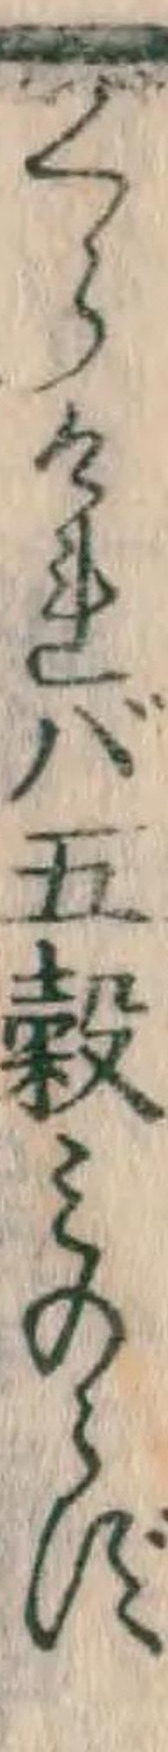くらければ五穀みのらず
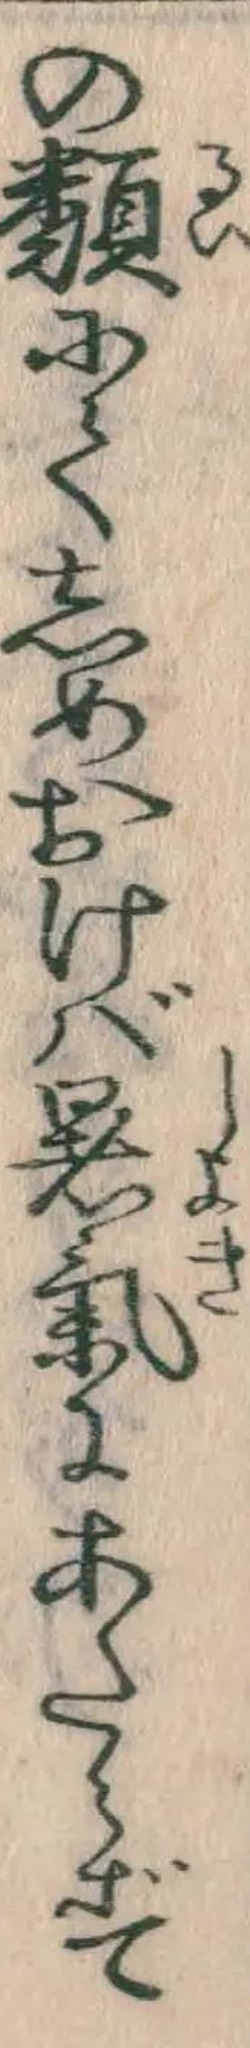の類にてしめおけば暑気にあたらず
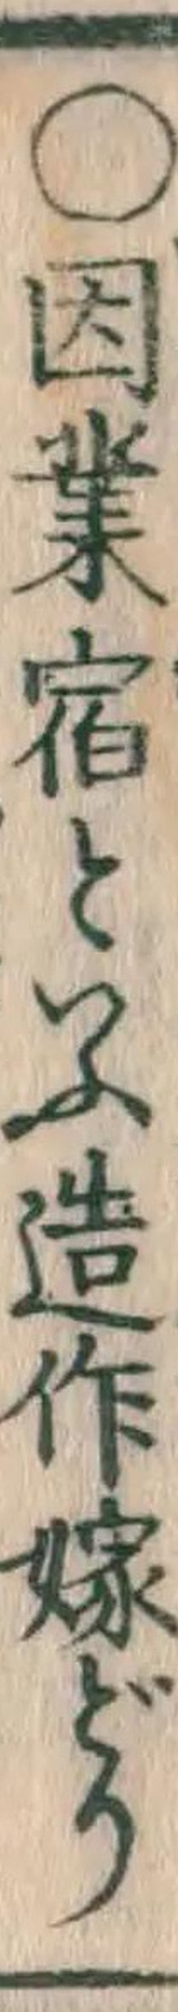○因業宿といふ造作嫁どり
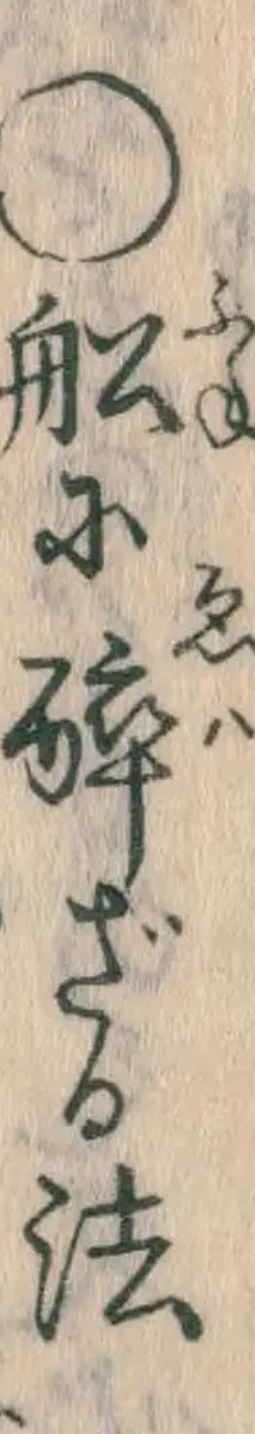○船に酔ざる法
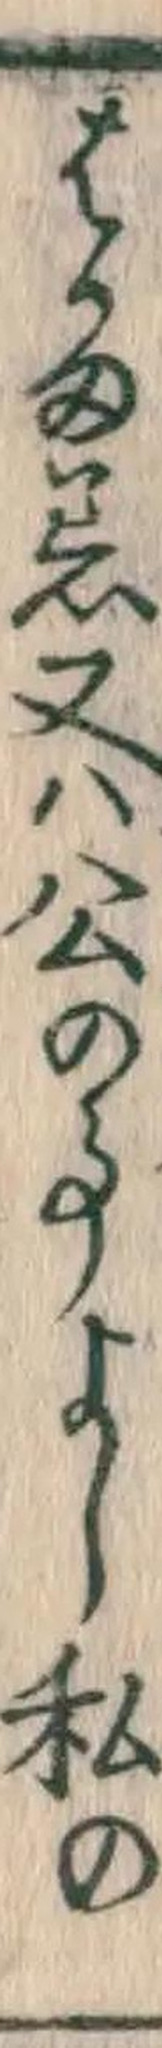はかま着又は公の事よし私の
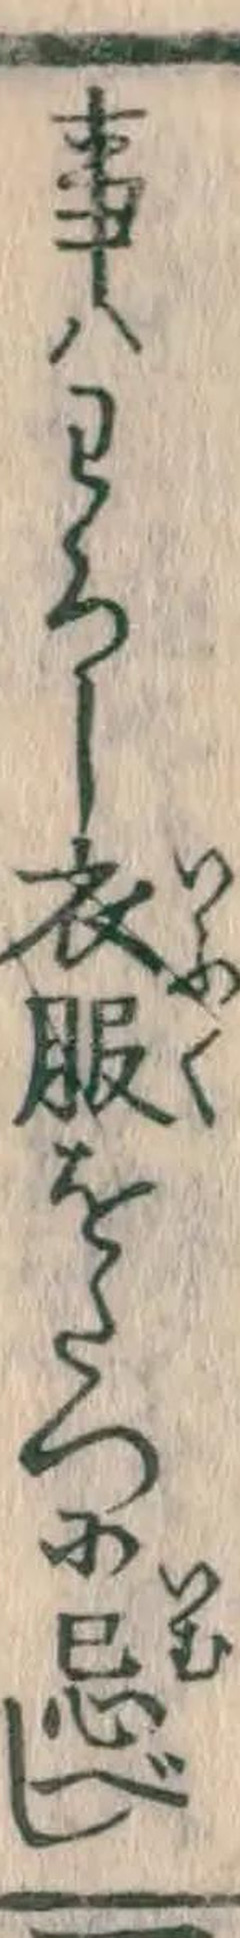事はわろし衣服をたつに忌べし
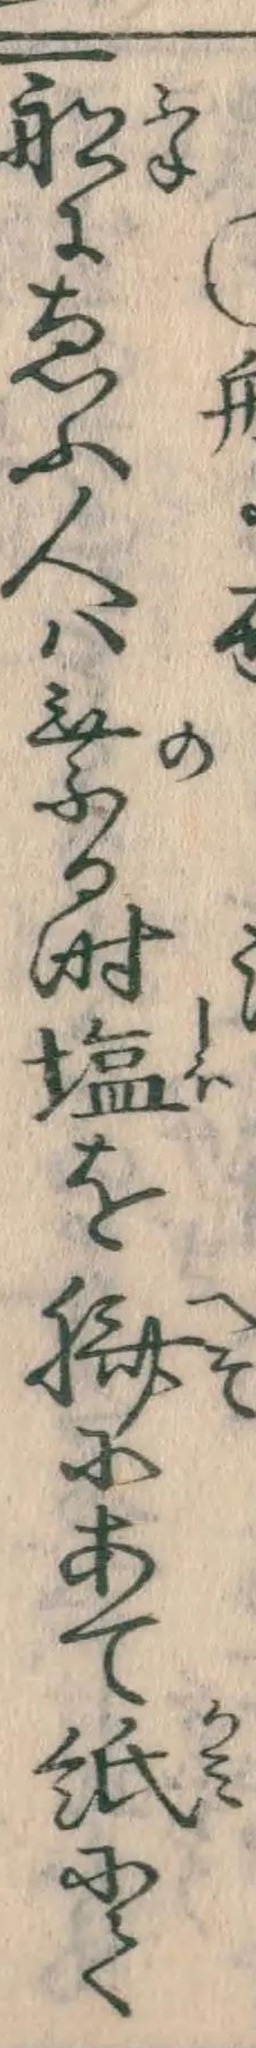一船にゑふ人は乗る時塩を臍にあて紙にて
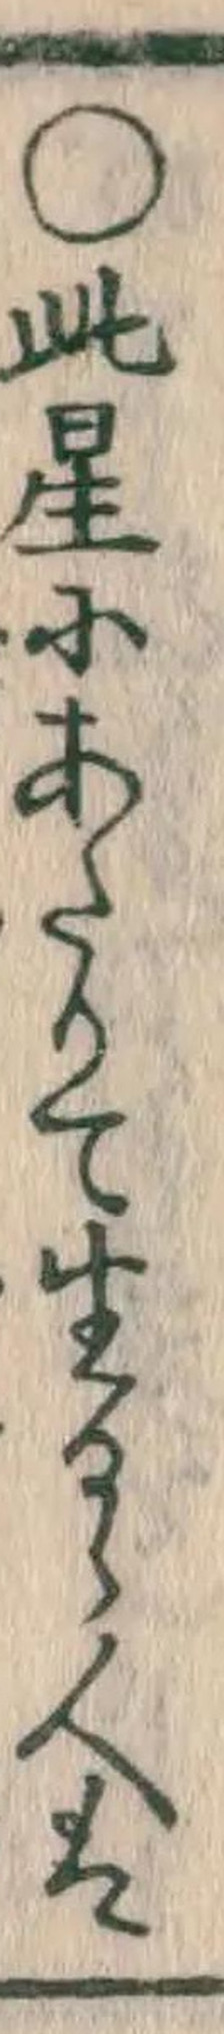○此星にあたりて生るゝ人は
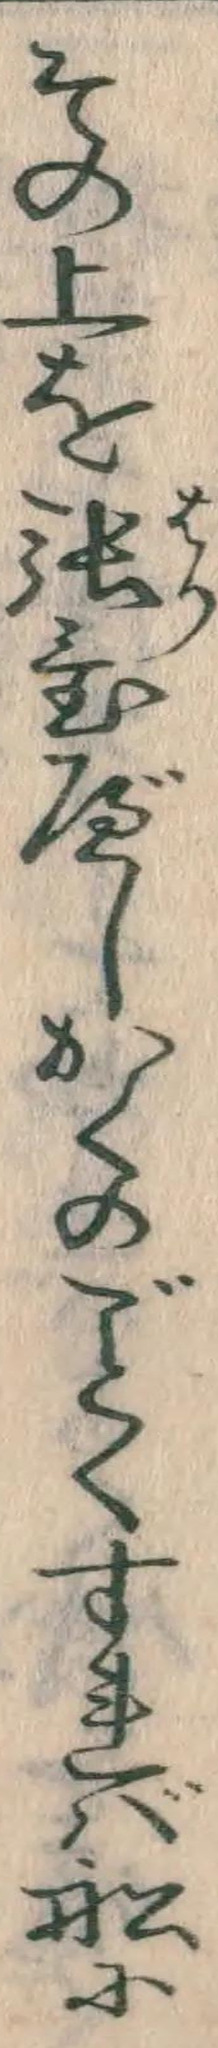その上を張置べしかくのごとくすれば船に
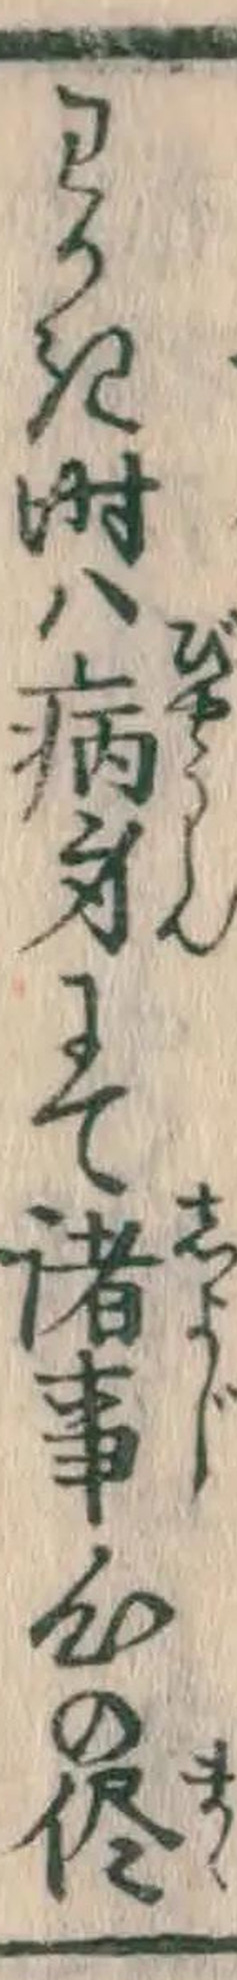わかき時は病身にて諸事心の儘
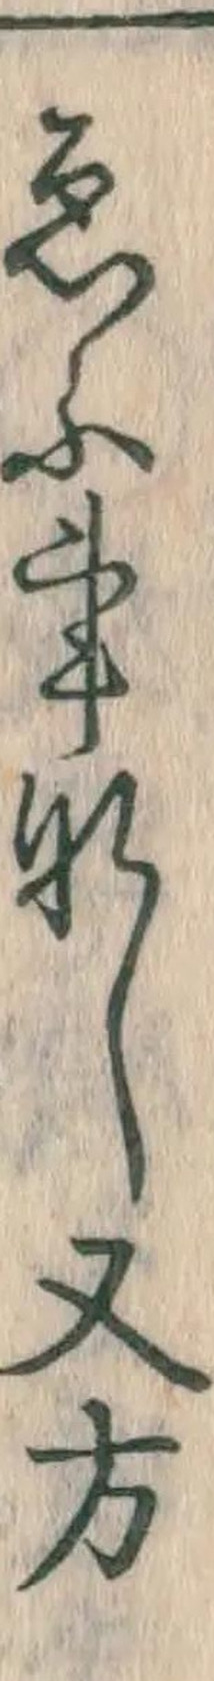ゑふ事なし又方
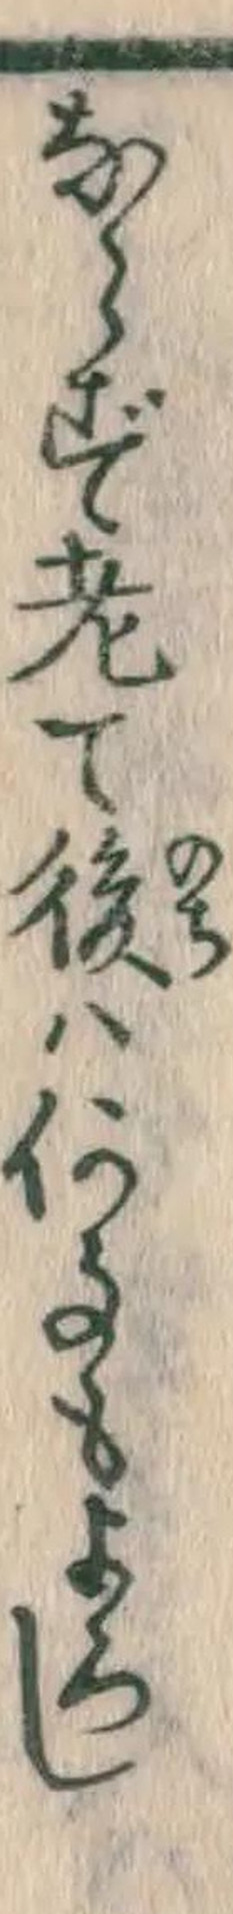ならず老て後は何事もよろし
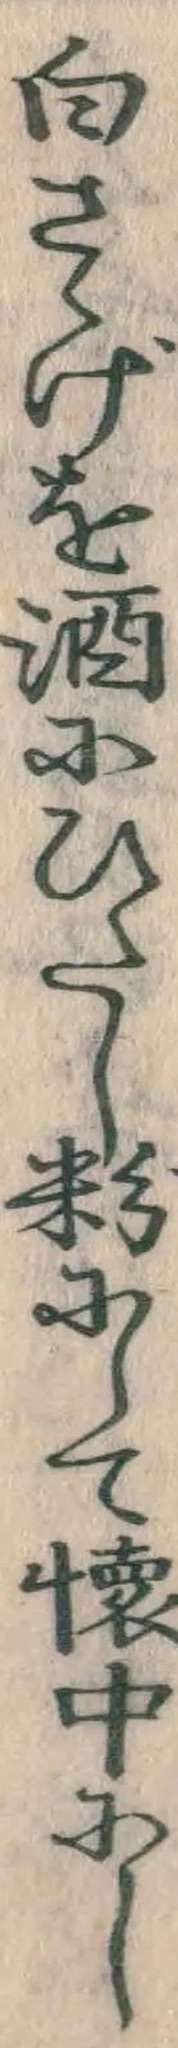白さゝげを酒にひたし粉にして懐中にし
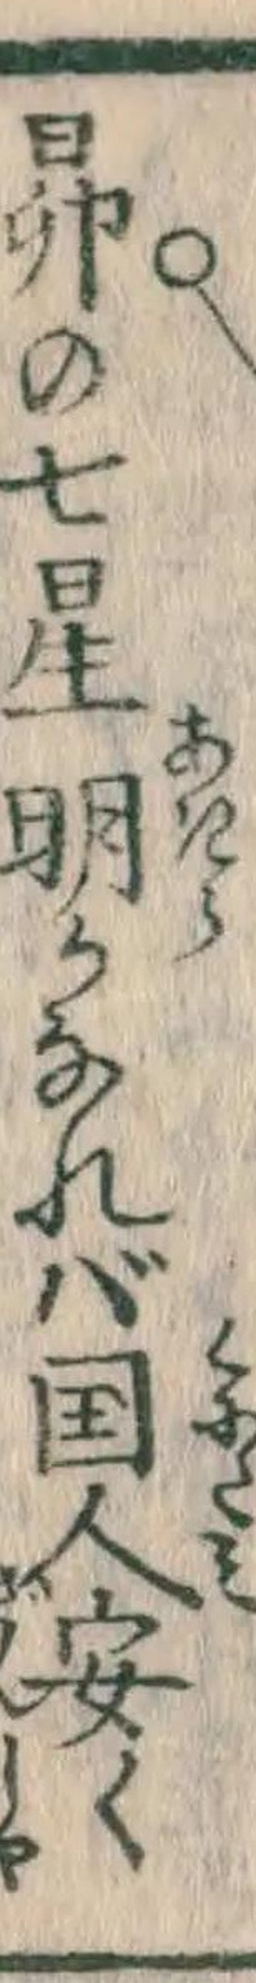昴の七星明かなれば国人安く
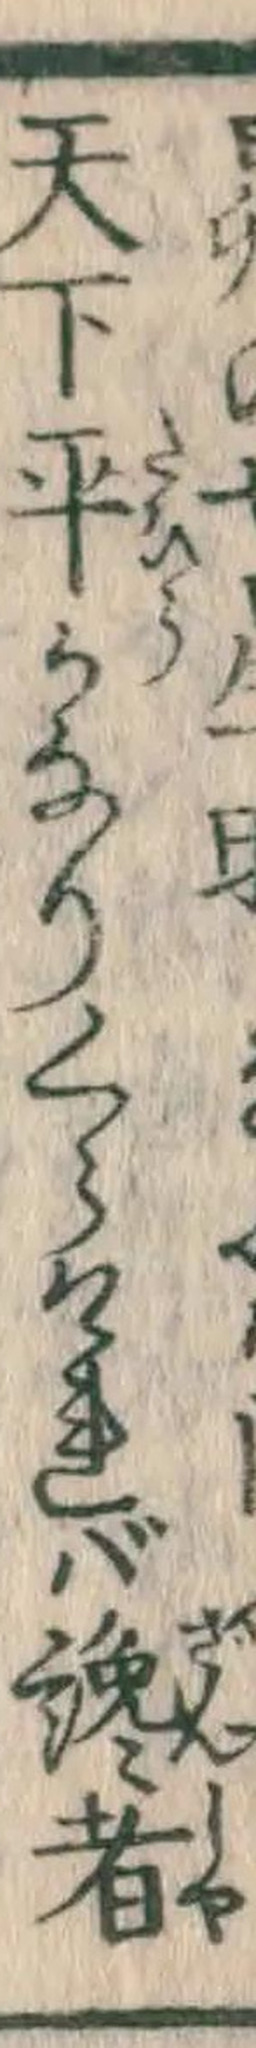天下平かなりくらければ讒者
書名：広益秘事大全 3巻. [2]
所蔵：国立国会図書館 National Diet Library, JAPAN
